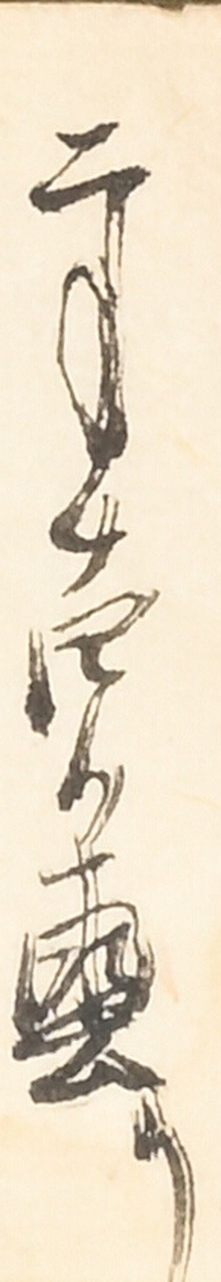二月十四日曇り
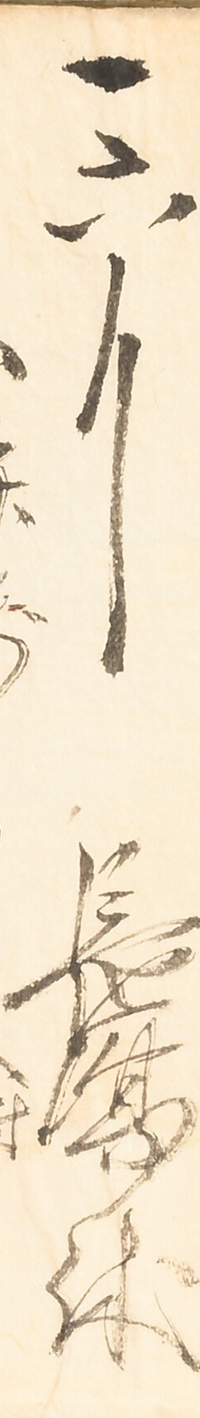一六人長橋休
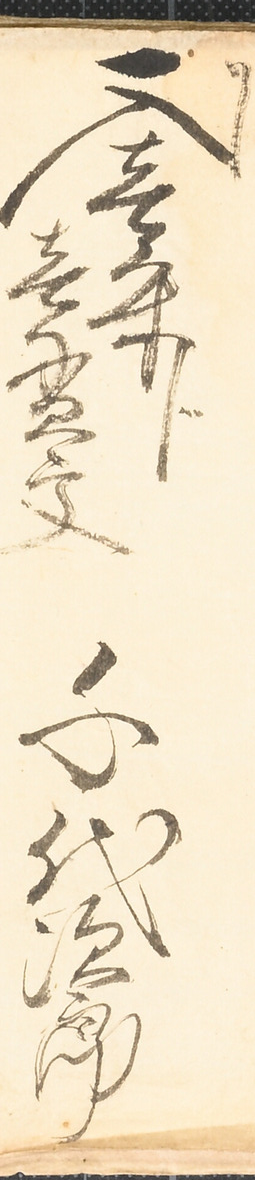一入壱朱分千代次郎
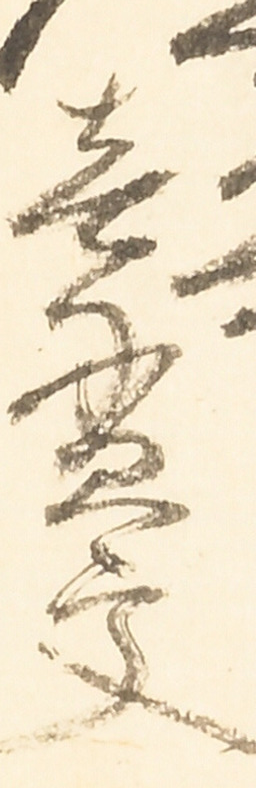壱貫文
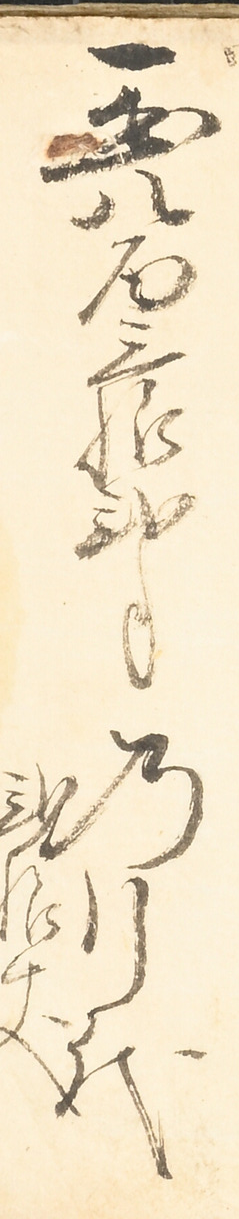一出八百三拾弐のり代

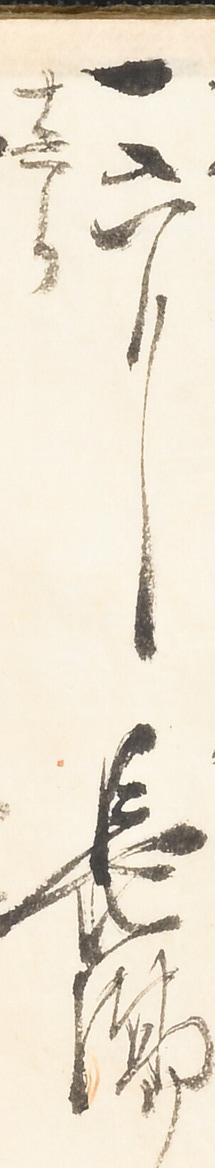一六人長場
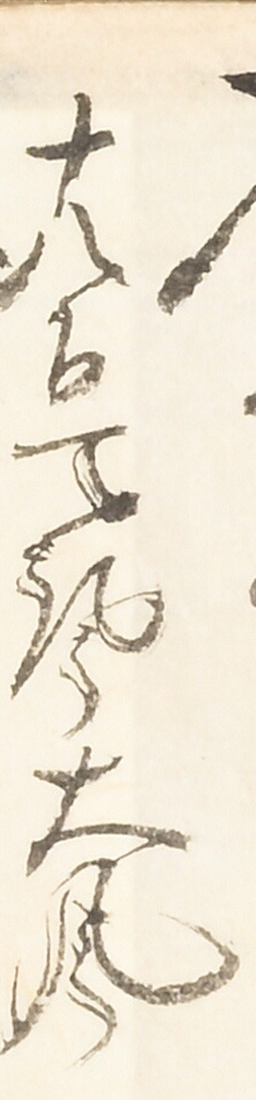十八日天気大風

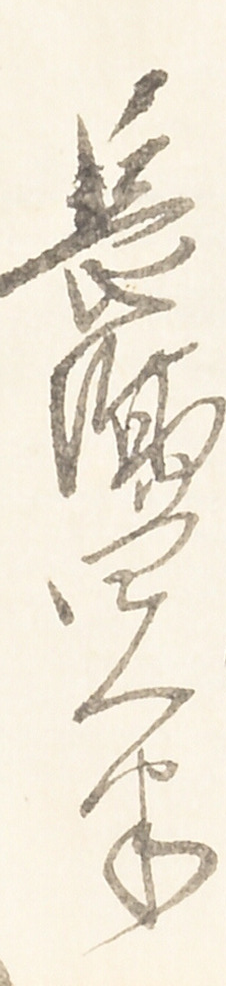長橋四人半

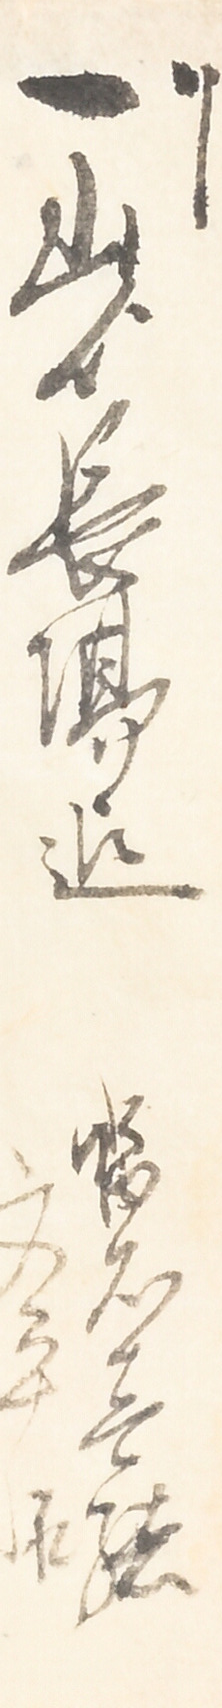一山ゟ長橋迠沓石壱張
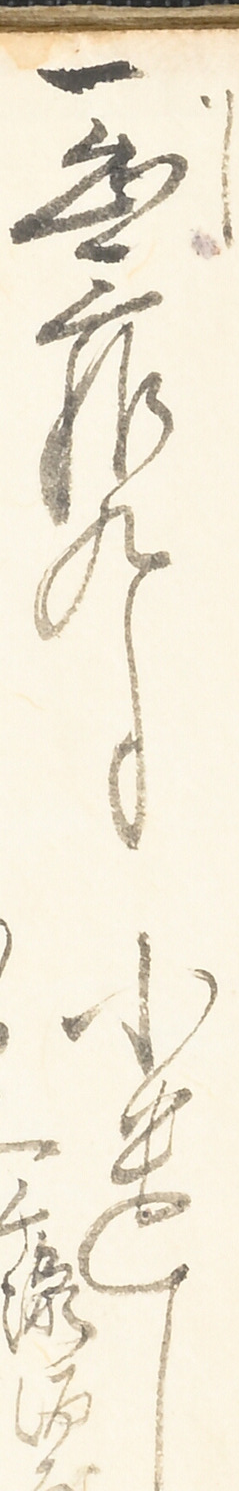一出三拾九小遣し

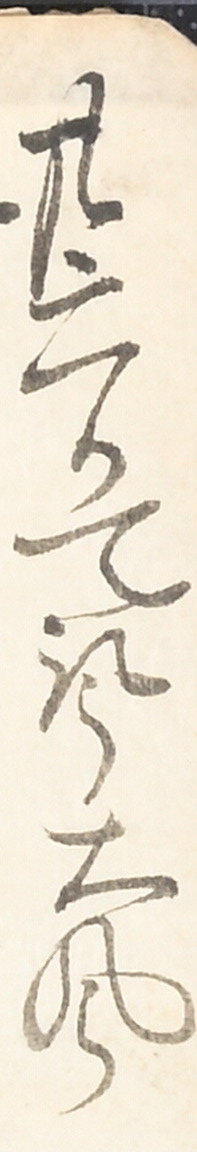廿六日天風大風
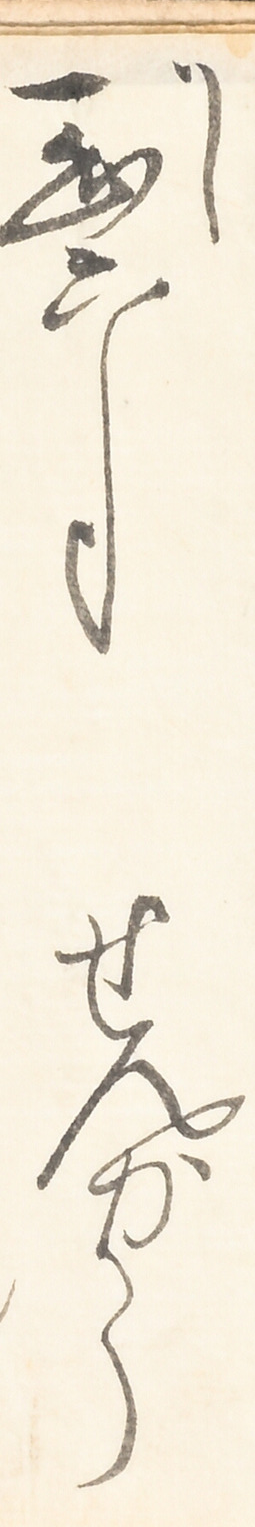一出六せんかう
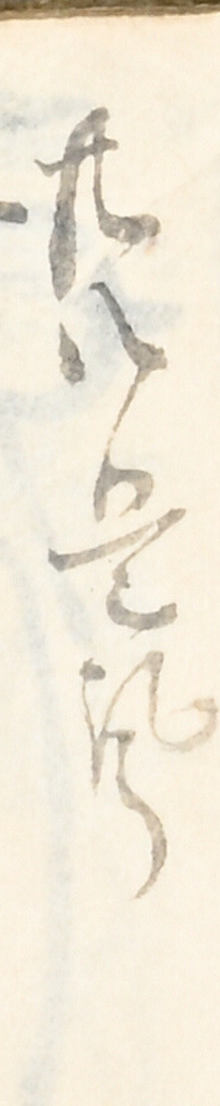廿七日

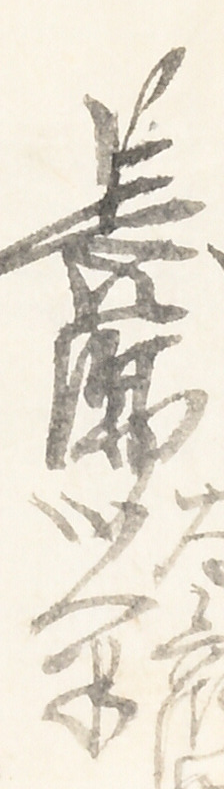長橋弐人半
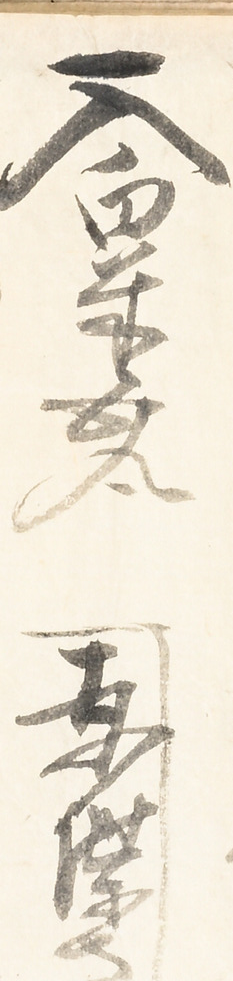一入白米五合東渫さま

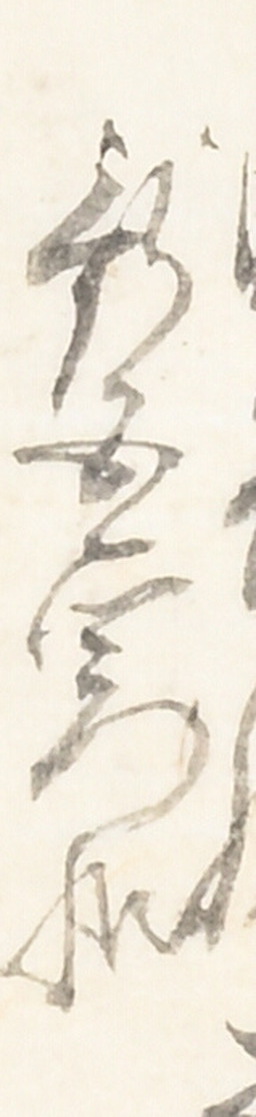新五右衛門殿
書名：天保十巳癸（亥）年正月大吉祥日萬日記控帳
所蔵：伊那市立高遠町図書館・合同会社AMANE
